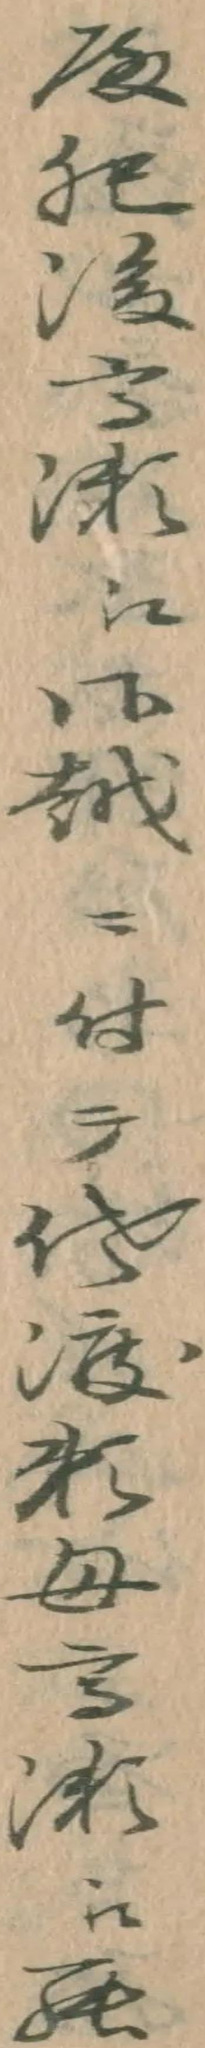殿肥後高瀬江御越に付て佐渡頼母高瀬江罷
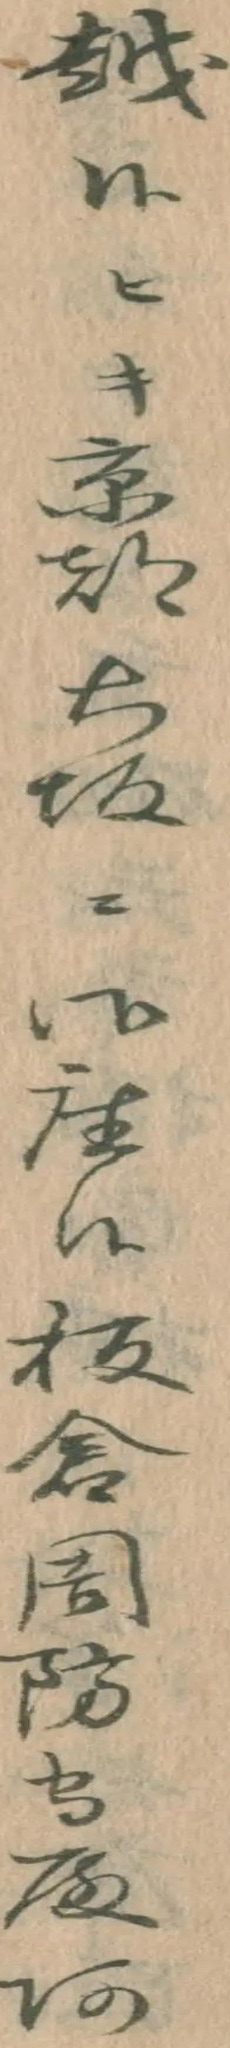越候ヒキ京都大坂に御座候板倉周防守殿阿
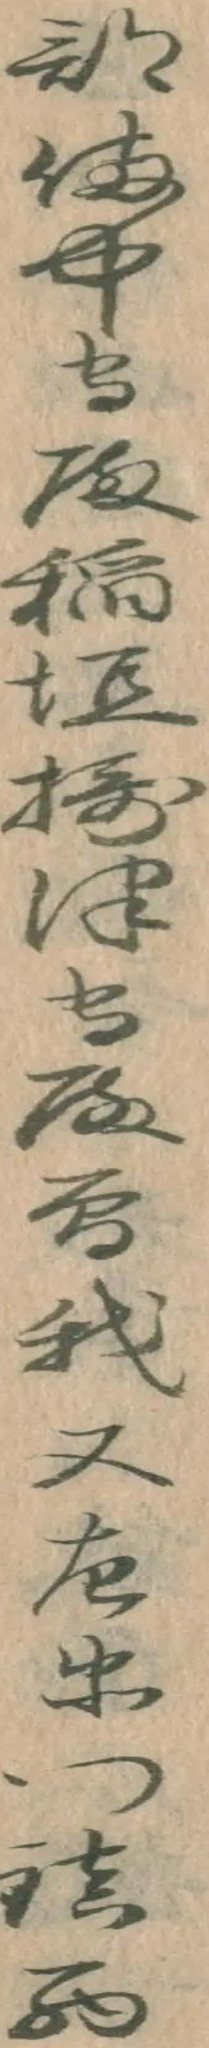部備中守殿稲垣摂津守殿曽我又左衛門鎮西
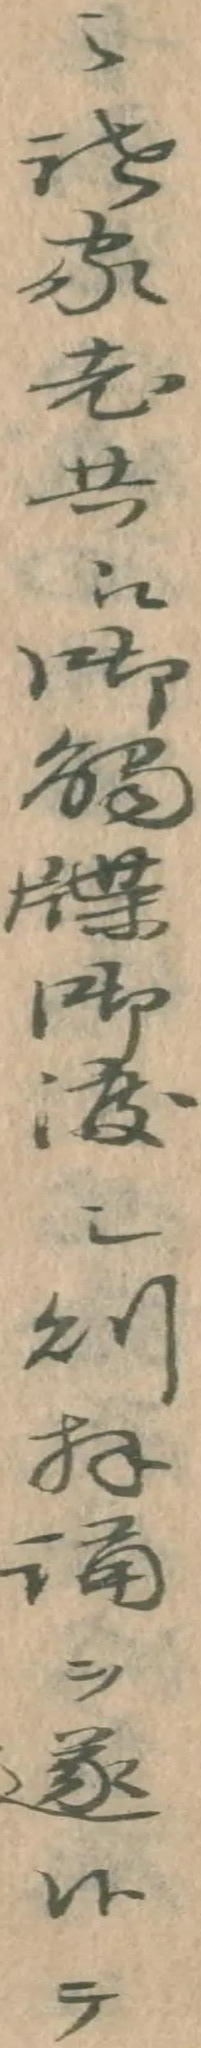之諸家老共江御触牒御渡シ則拝誦ヲ遂候テ
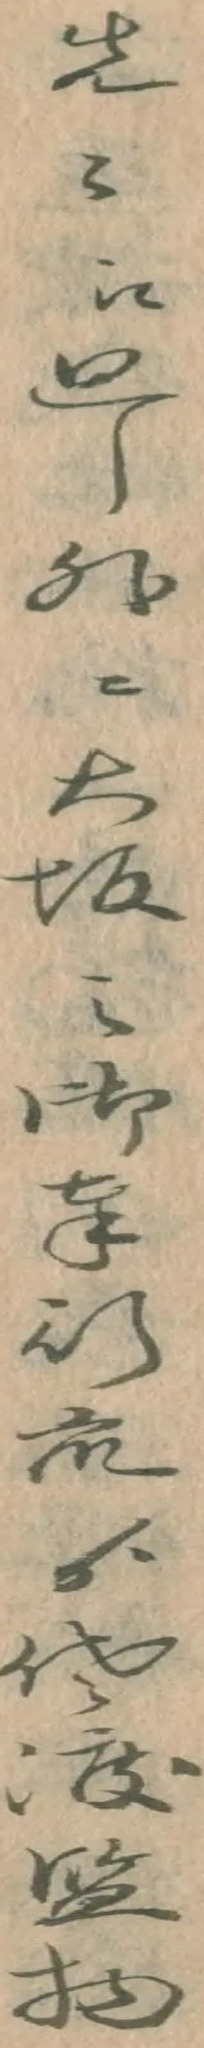先々江廻し外に大坂之御奉行衆ゟ佐渡監物
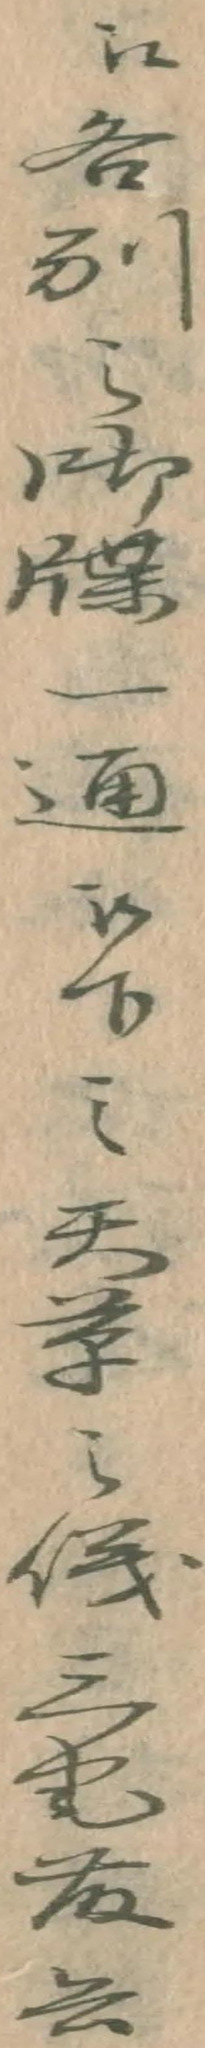江各別之御牒一通被下之天草之儀三宅藤兵
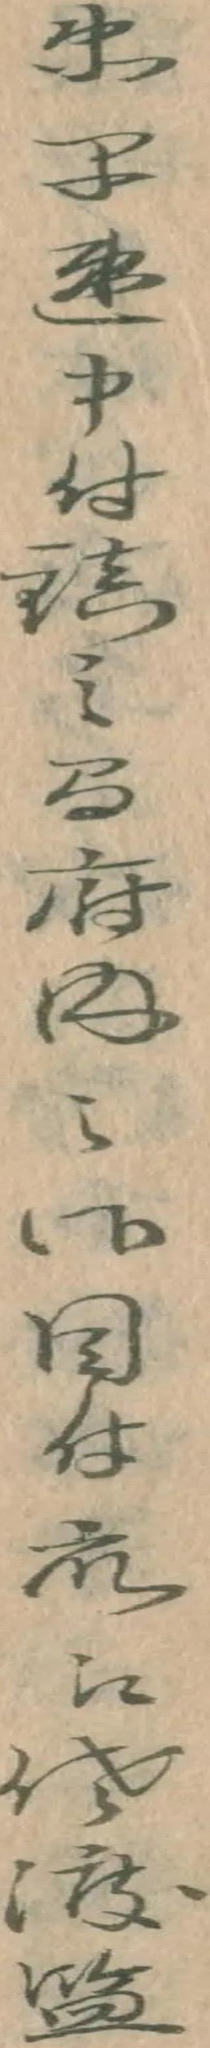衛早速申付鎮之間府内之御目付衆江佐渡監
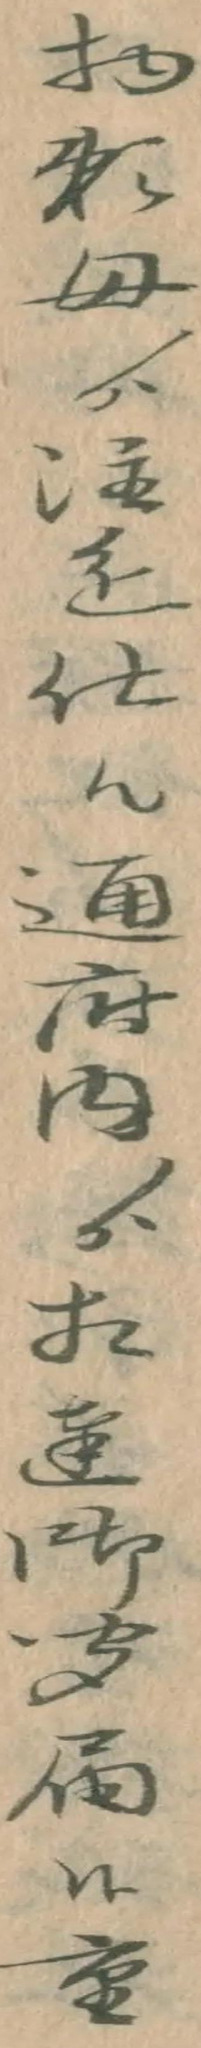物頼母ゟ注進仕ん通府内ゟ相達御聞届候重

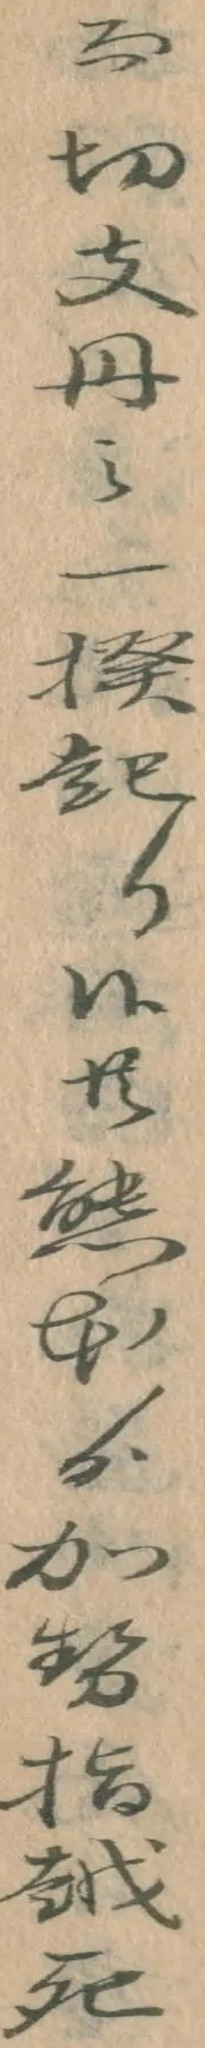而切支丹之一揆起り候共熊本ゟ加勢指越死
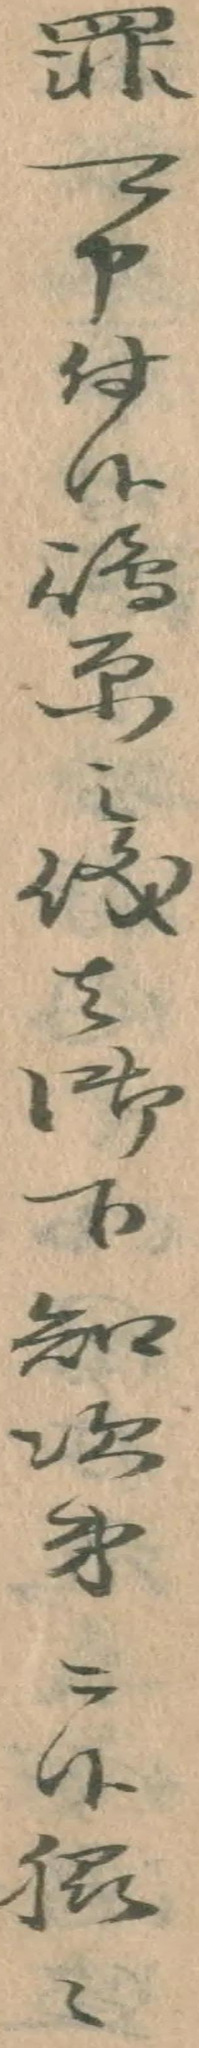罪可申付候島原之儀は御下知次第に候脇々
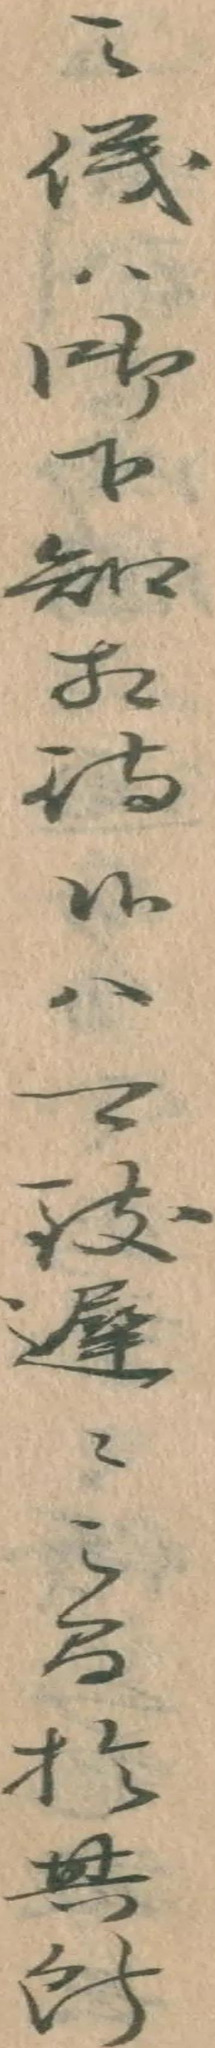之儀は御下知相待候は可致遅々之間於其所
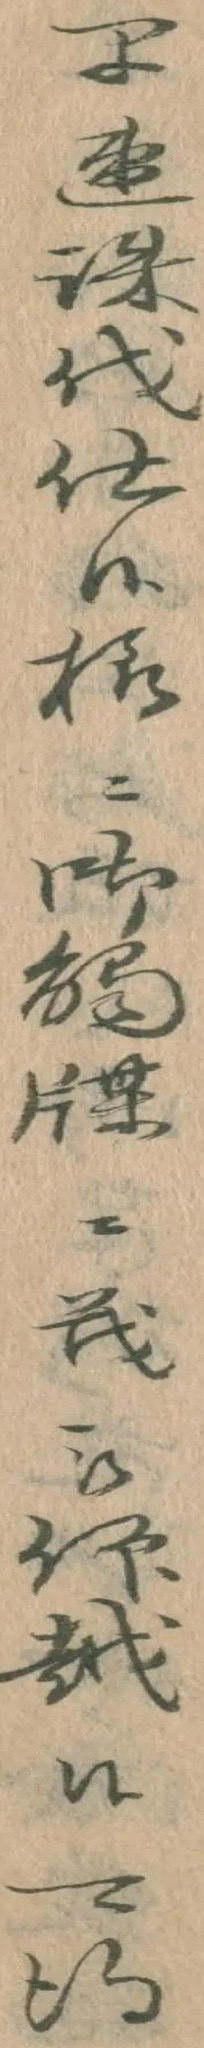早速誅伐仕候様に御触諜にも被仰越候可得
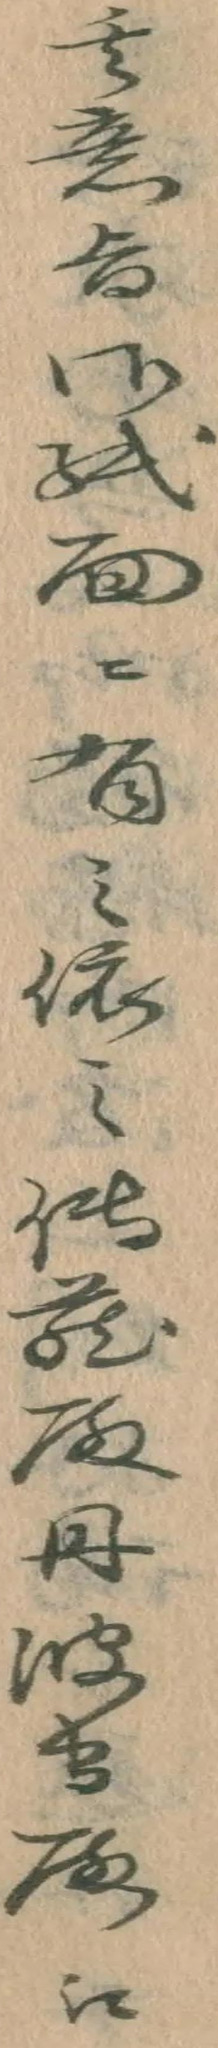其意旨御紙面に有之依之伝蔵殿丹波守殿江
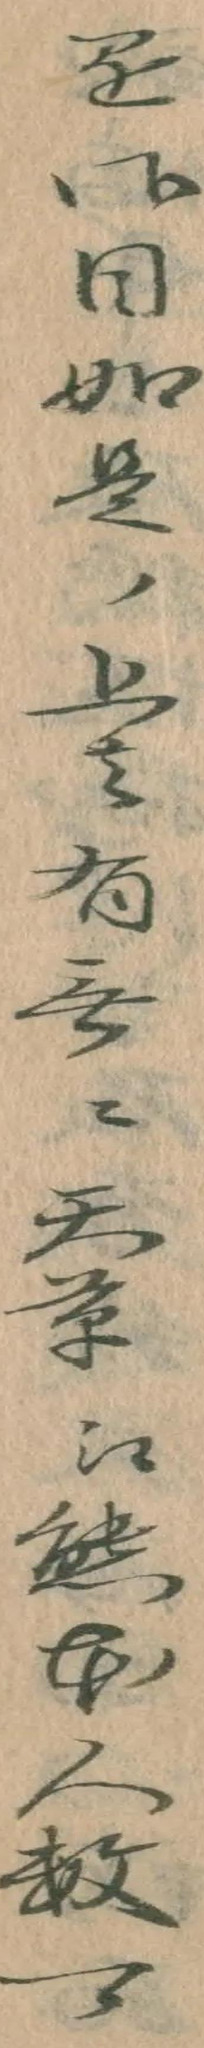懸御目如是ノ上は有無に天草江熊本人数可
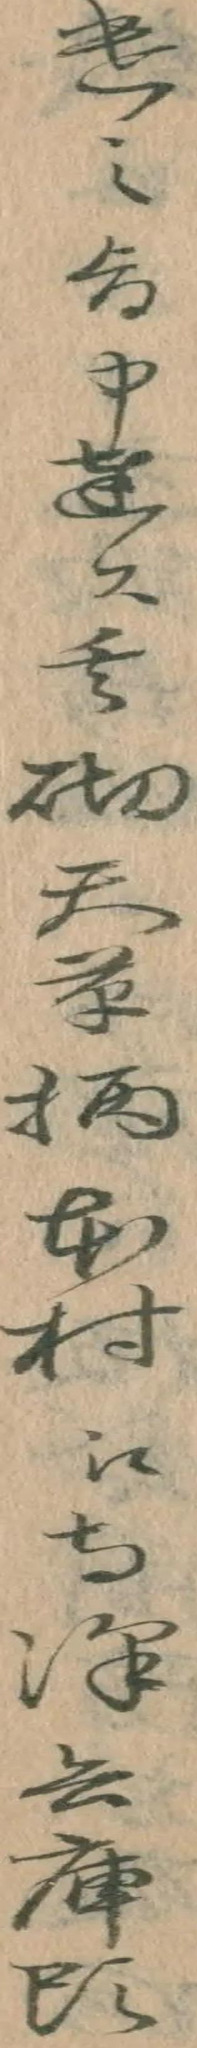遣之旨申達ス其砌天草柄本村江寺沢兵庫頭
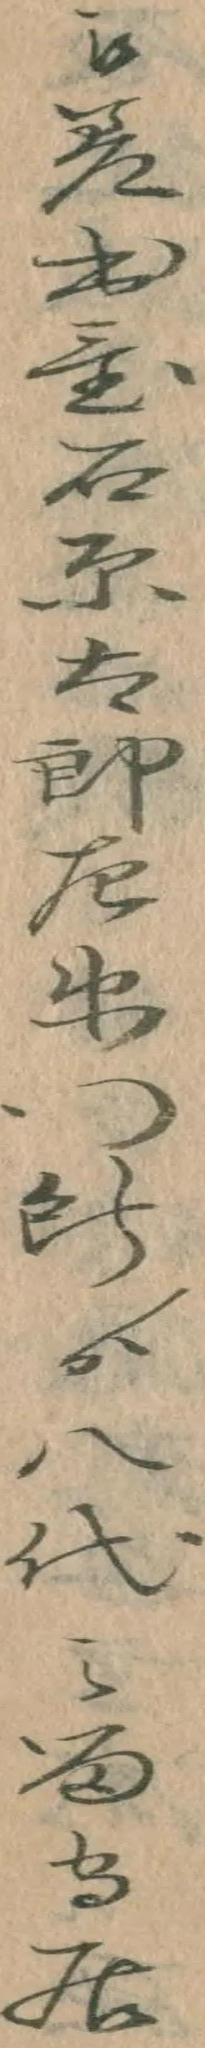江差出置石原太郎左衛門所ゟ八代之留守居
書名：切支丹御退治記 49巻. [3]
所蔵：国立国会図書館 National Diet Library, JAPAN
